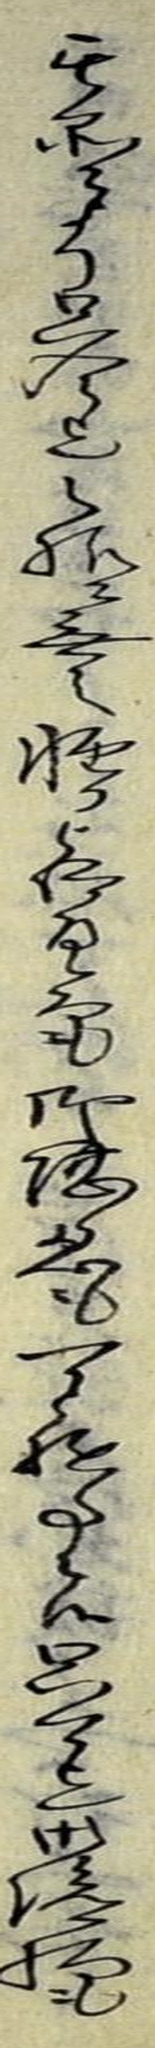其品ニより只今迄之様ニ無之軽ク被仰付候而も御堪忍も可被遊事ニ候只今迄御倹約も
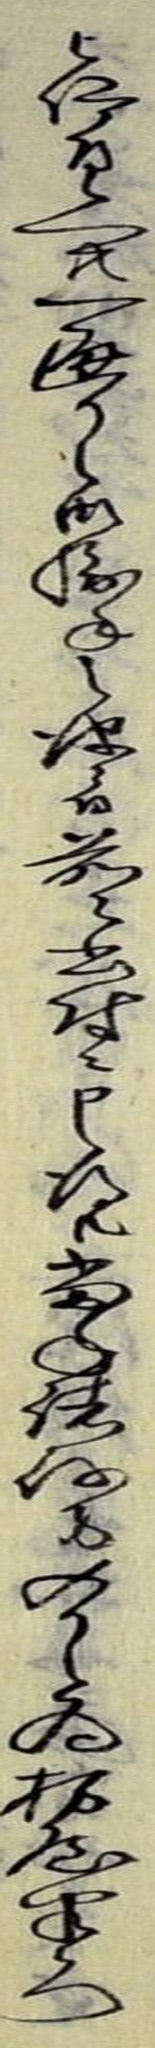被仰付候へ共一通り之御勝手之儀ニ付前々書付ニ申候得共当年諸役方〆り之為栃屋半右衛門
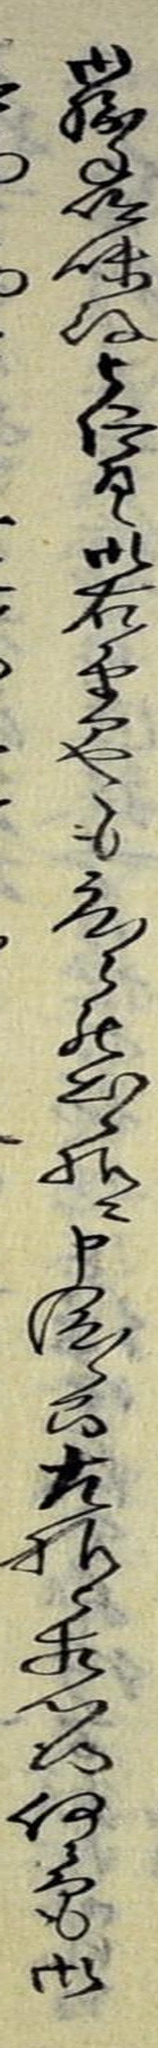御勝手吟味役被仰付候御右筆部屋へも度々罷出候様ニ申渡候間左様被相心得何ニ而も御
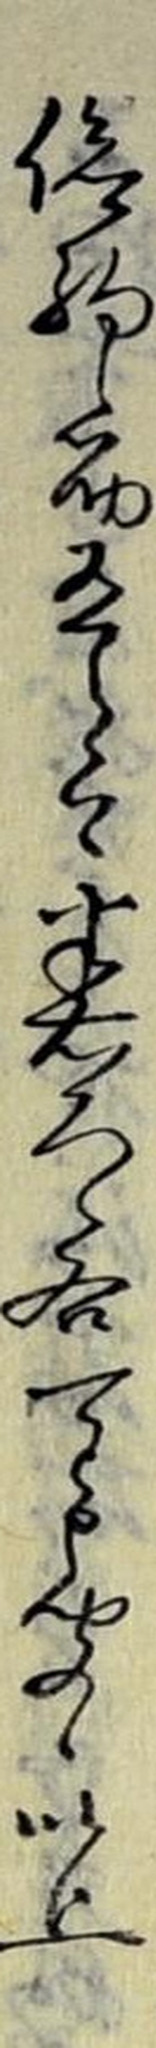倹約之筋有之候ハヽ半右衛門へ各可被申聞候以上
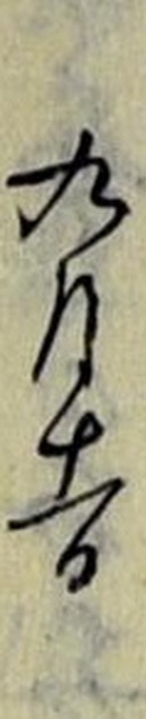九月十一日
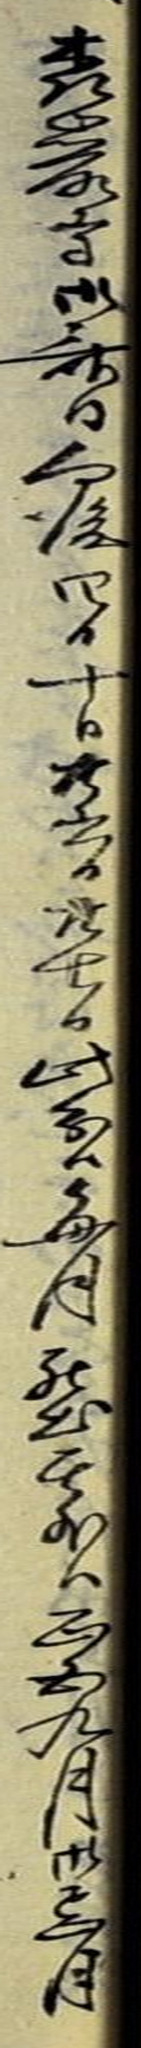一森厳寺御斎日向後四日十日廿六日廿七日此分ハ毎月罷出其外ハ正五九月御忌月
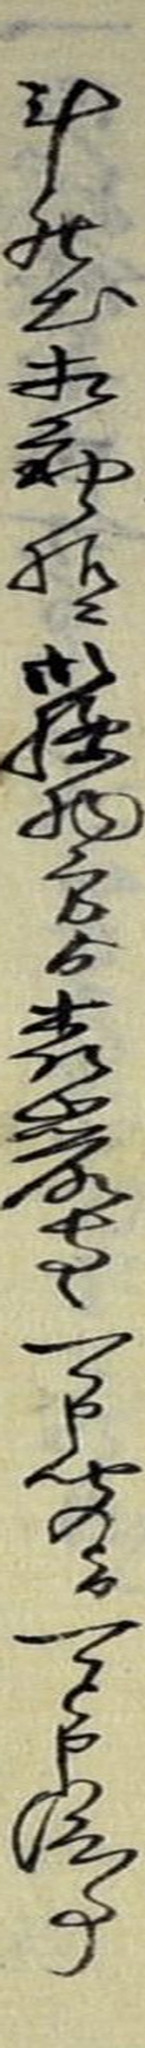斗罷出相勤候様ニ御腰物方ゟ森厳寺へ可申聞旨可被申渡事
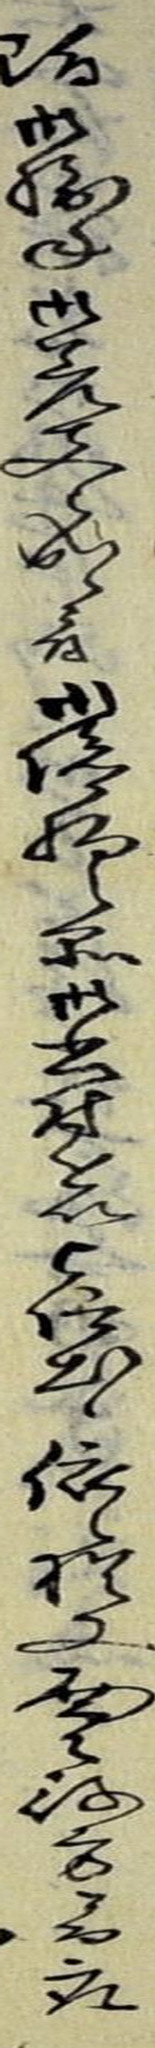附御勝手御差支被成候ニ付御倹約之品御書付を以被仰出候依之猶又面々役方ニ而取
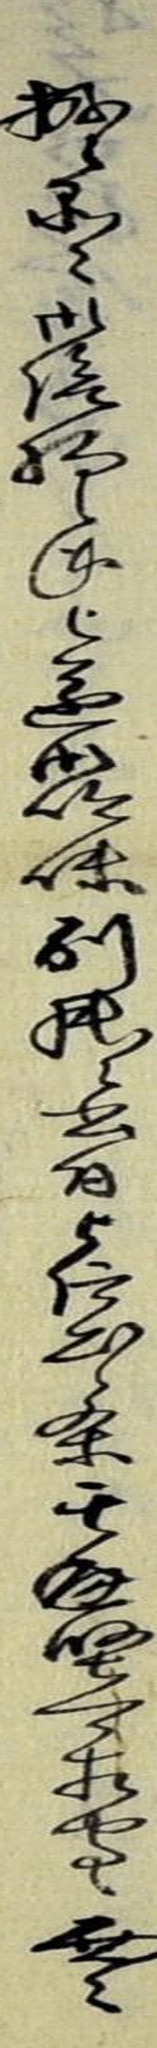扱之品々御倹約之趣被遂御吟味別紙ニ書付被仰出候条其通堅可相守候面々
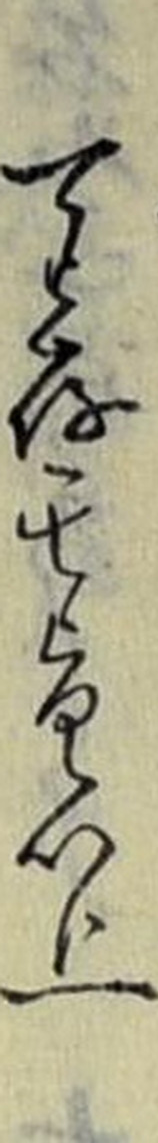可被存其旨候以上
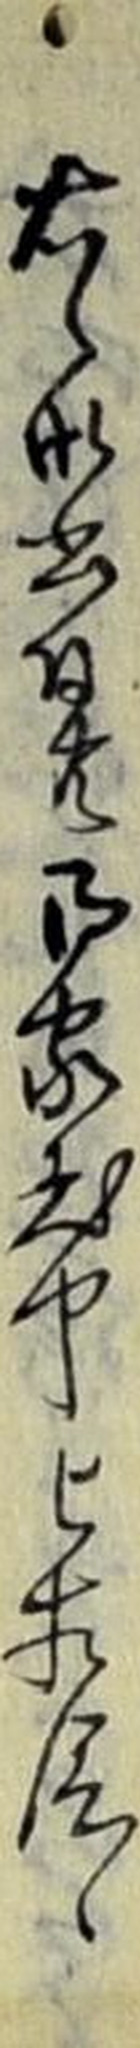右之御書付共御家老中被相渡候
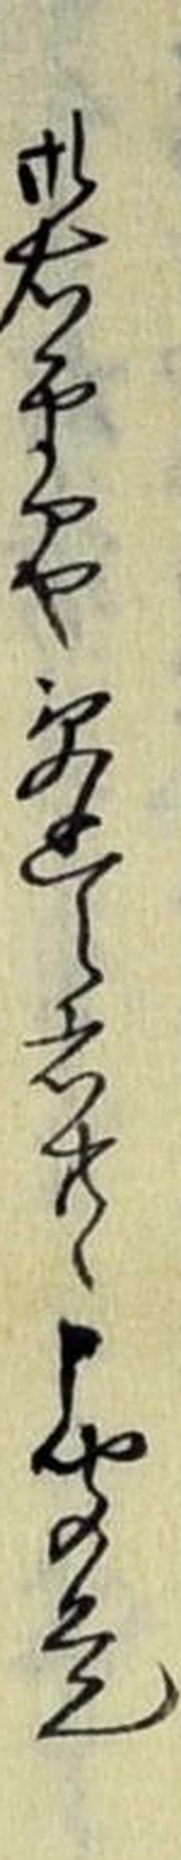御右筆部屋受込之者共へ申聞覚
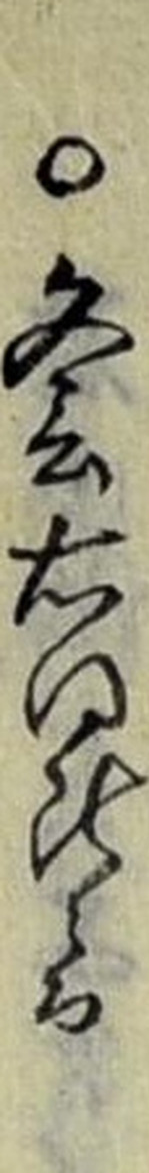〇文言右同断ニ而
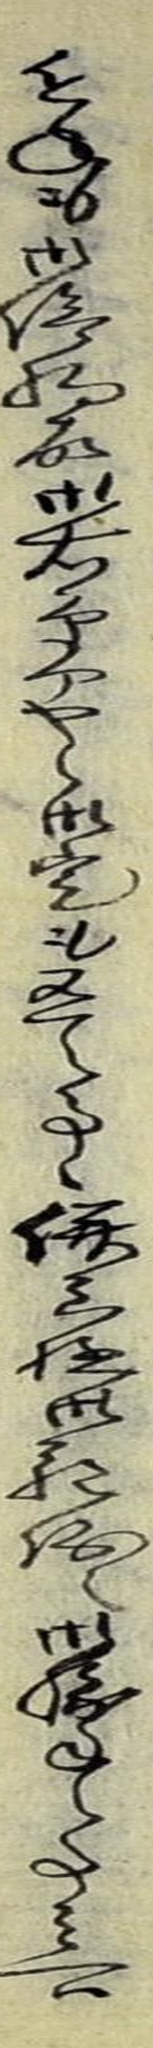近年も御倹約故御右筆部屋之御定も有之事候併至極御難儀之御勝手之事ニ候ヘハ
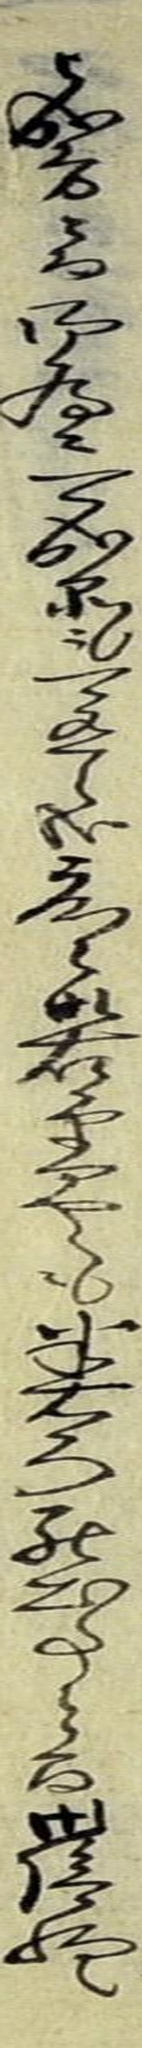被成方ニ而御為ニ可成品も可有之哉度々御右筆部屋へも半右衛門罷出事ニ候間御倹約之
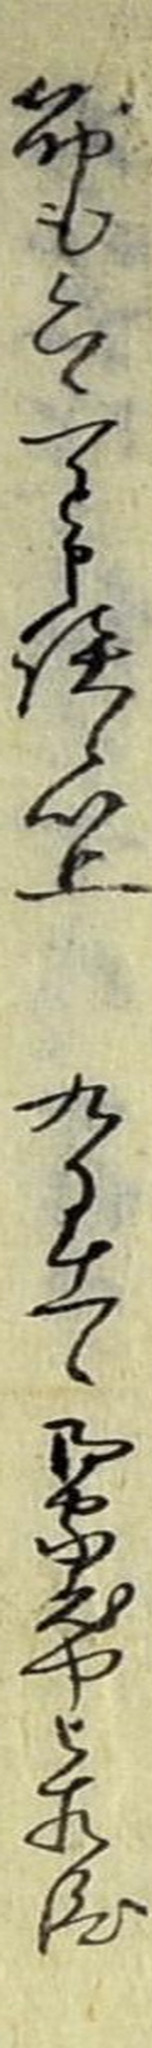筋も候ハヽ可被申談候以上九月十一日御家老中被相渡
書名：命令之部 一
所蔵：福井県文書館 Fukui Prefectural Archives
